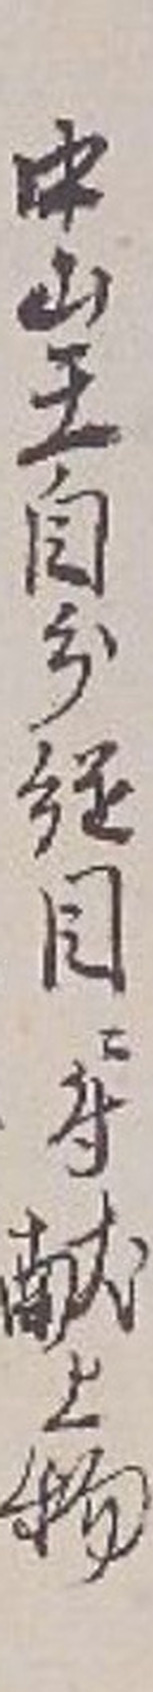中山王自分継目に付献上物
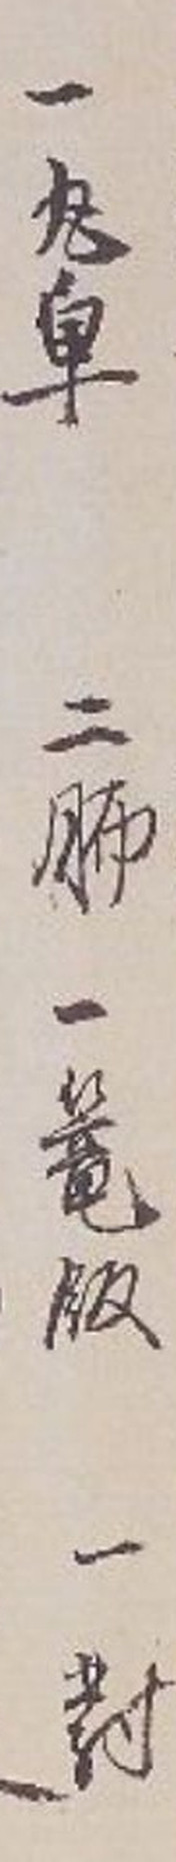一丸卓二脚一籠飯一対
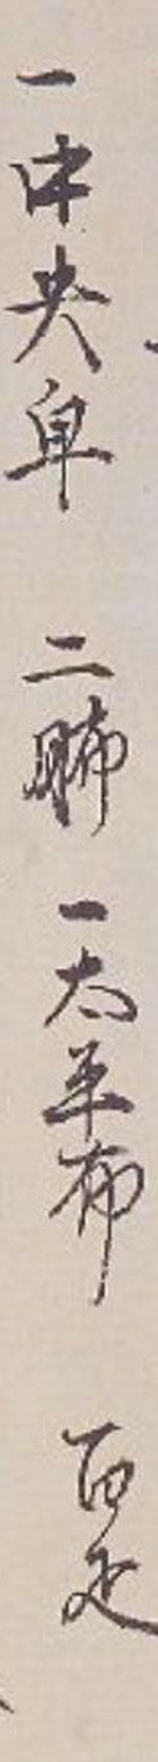一中央卓二脚一太平布百疋
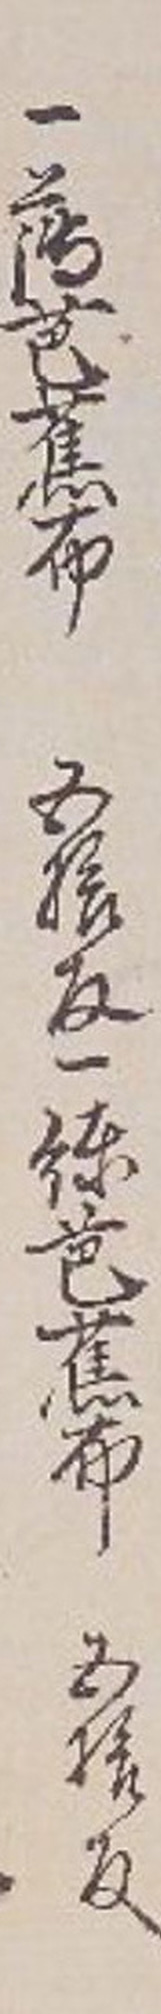一薄芭蕉布五拾反一練芭蕉布五拾反
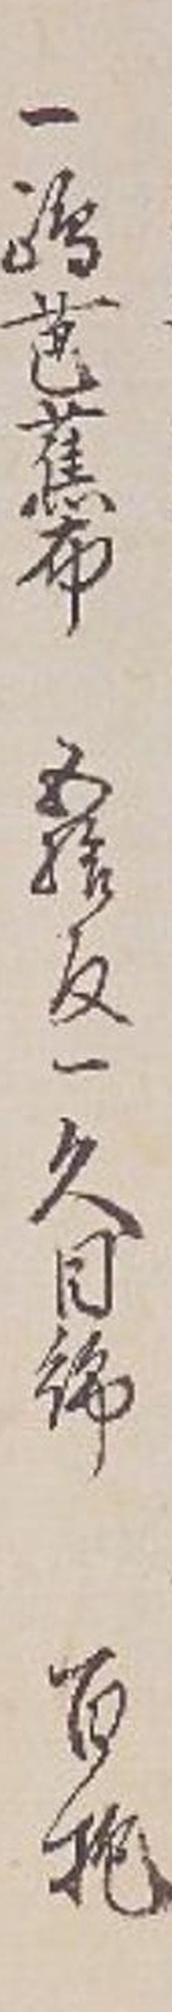一嶋芭蕉布五拾反一久目綿百把
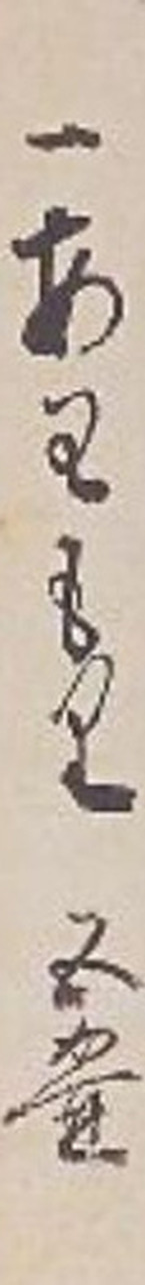一あわもり五壺
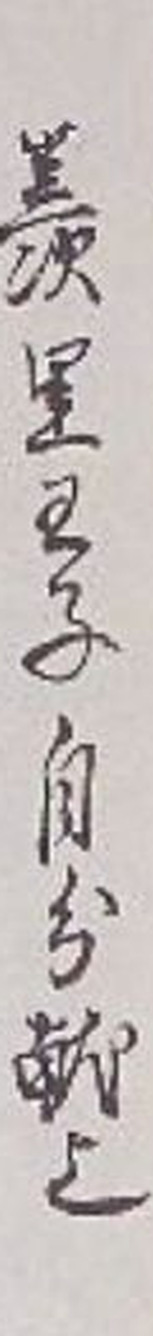美里王子自分献上
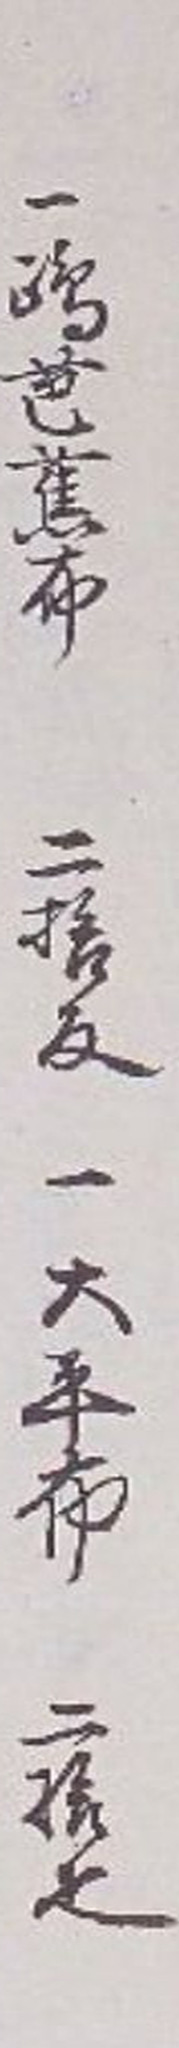一嶋芭蕉布二拾反一太平布二拾疋
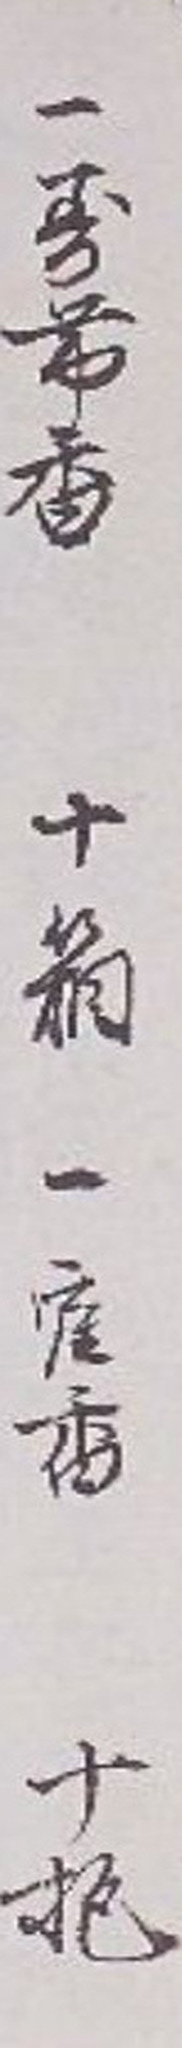一寿帯香十箱一官香十把
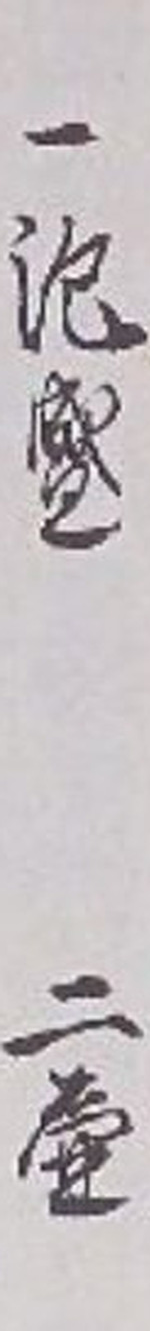一泡盛二壺
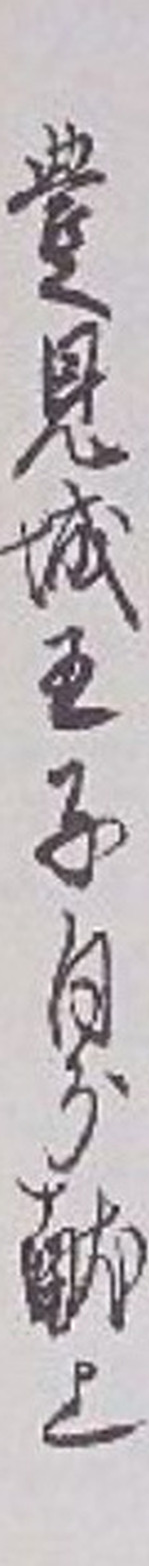豊見城王子自分献上
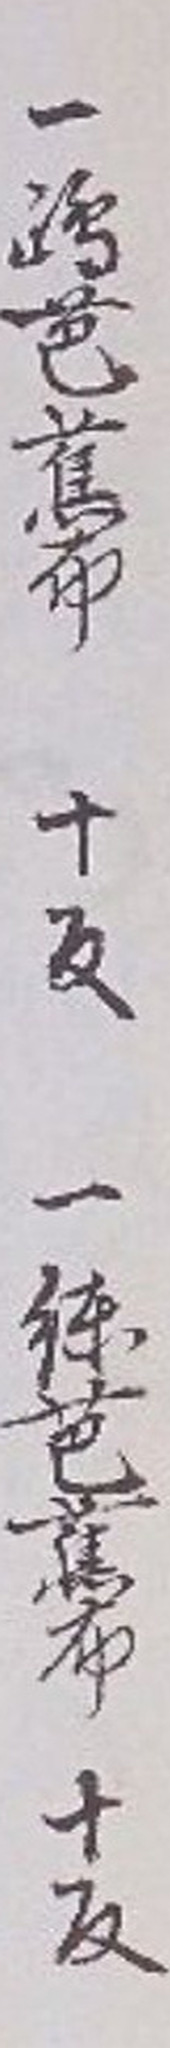一嶋芭蕉布十反一練芭蕉布十反
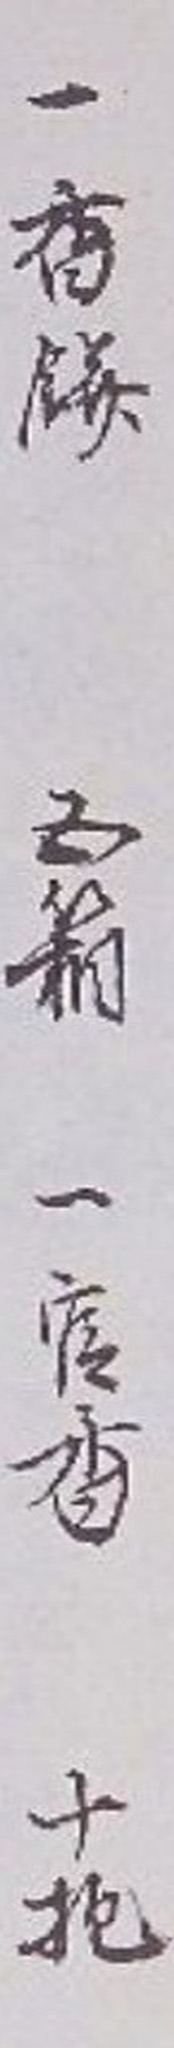一香餅五箱一官香十把
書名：宝永七年 琉球人来聘
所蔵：University of the Ryukyus Library
